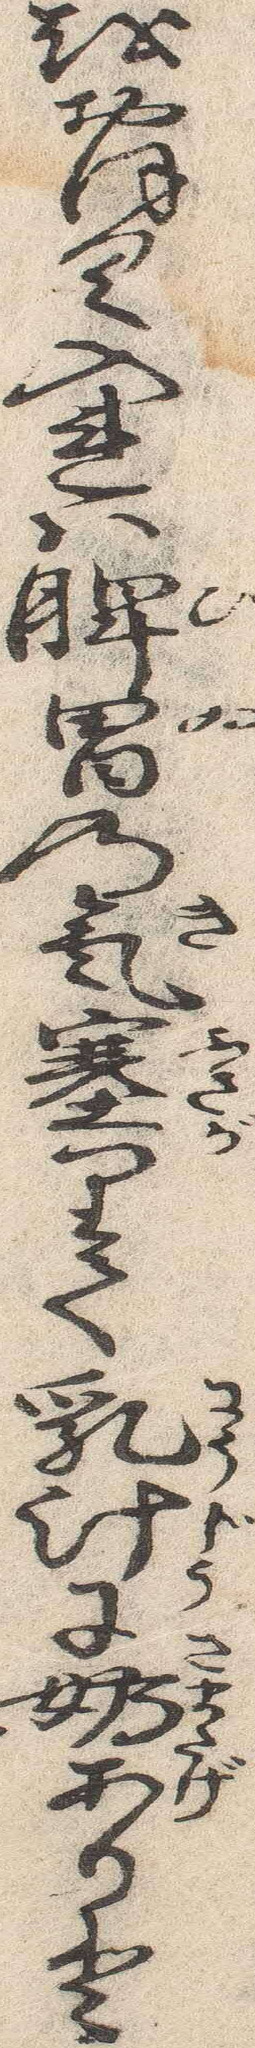をおほく入れは脾胃の氣塞りて乳汁に妨ありと
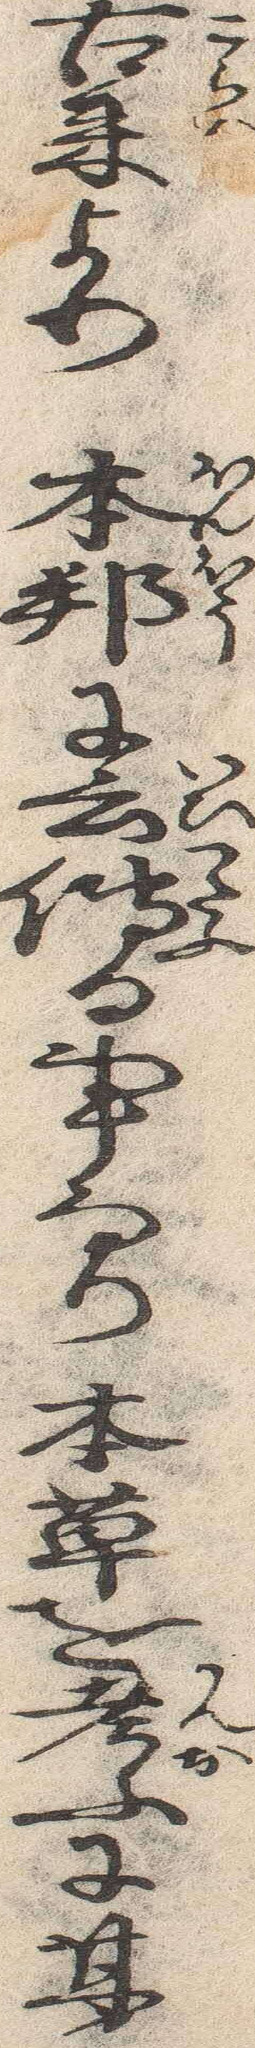古来より本邦に云傳る事なり本草を考ふに甘
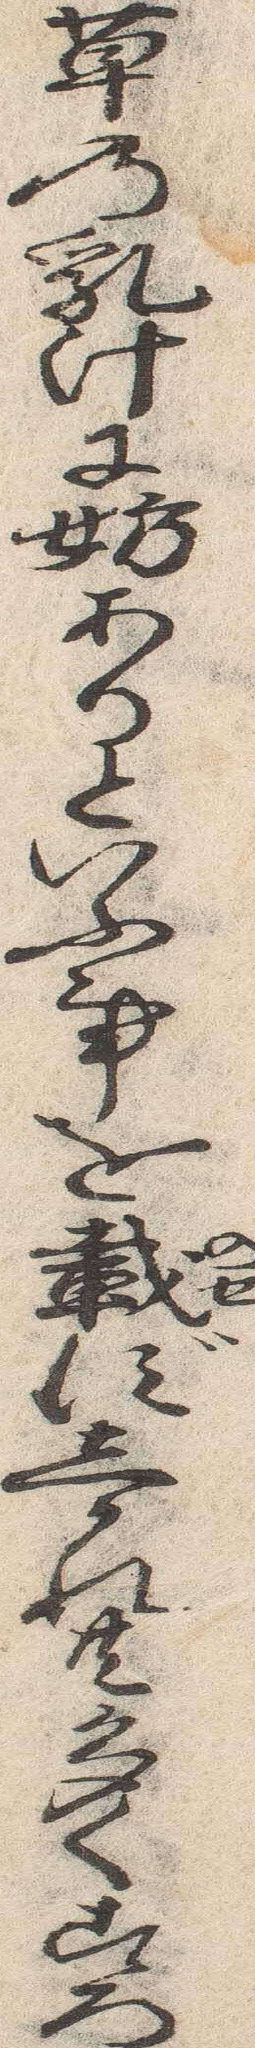草の乳汁に妨ありといふ事を載ずしかれ共多くこゝろ
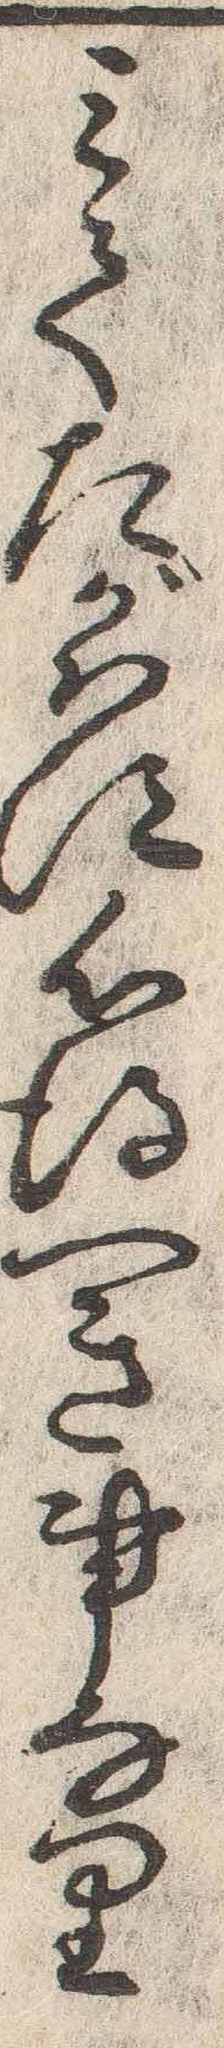みてたがはす心得へき事なり
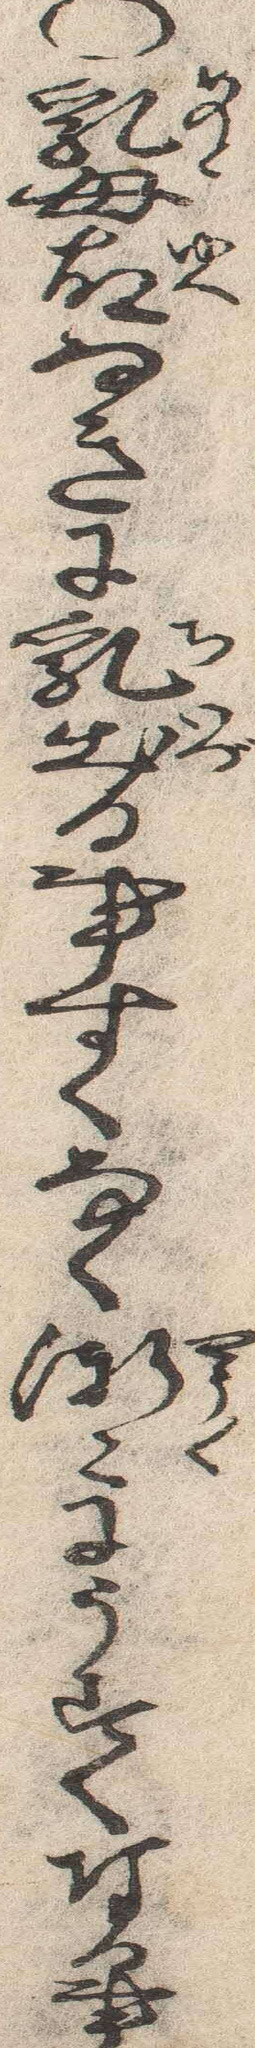◯乳母故なきに乳出る事すくなく漸〻にうすくなる事
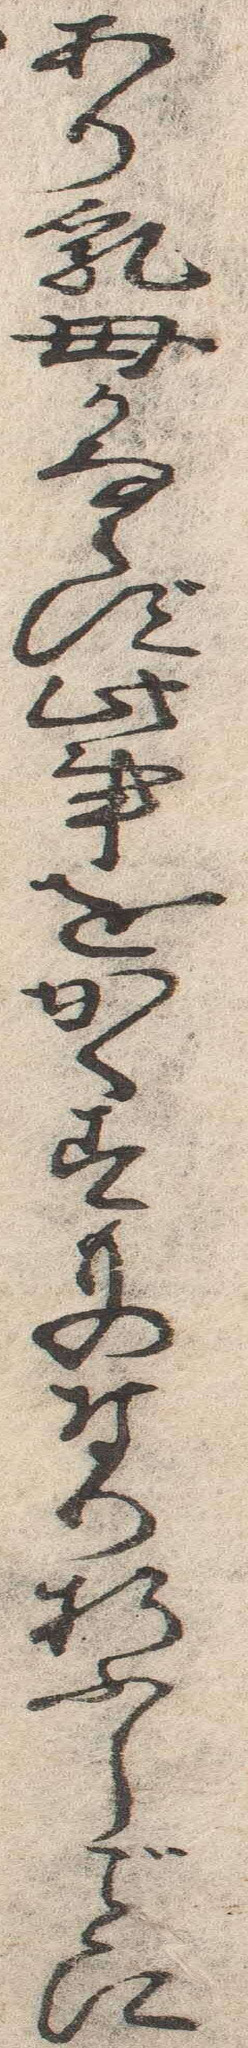あり乳母かならず此事をかくすものなり折ふしごとに
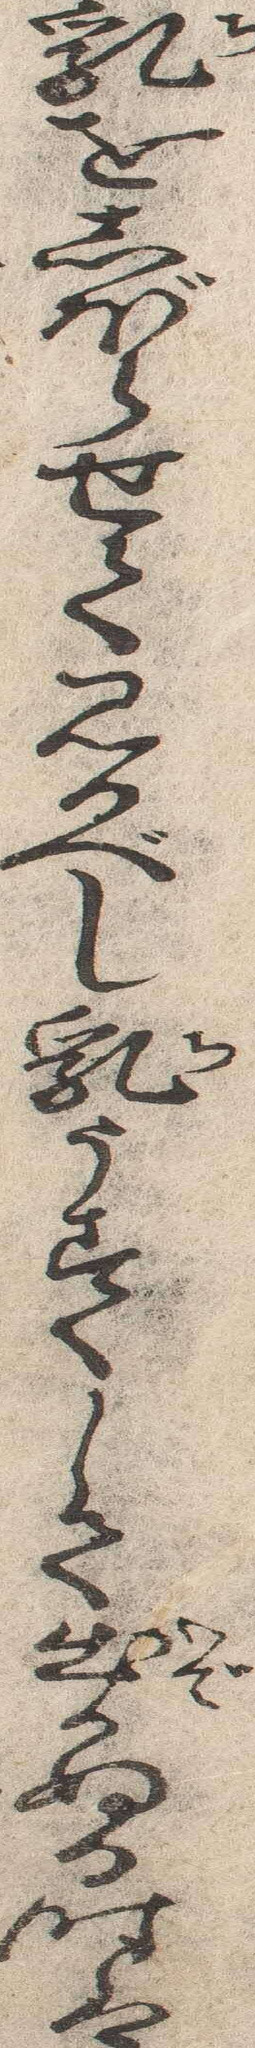乳をしぼらせて見るべし乳うすくして出かぬる時は
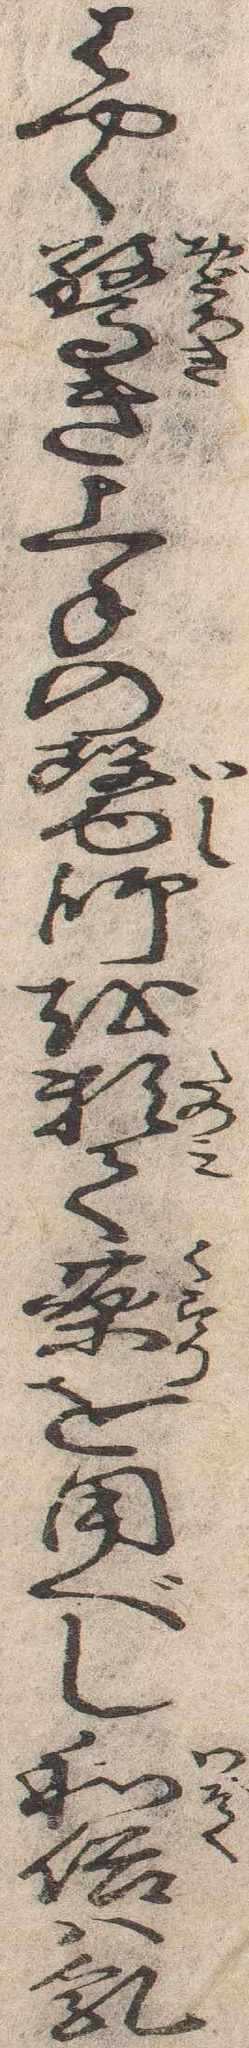はやく驚上手の醫師を頼て薬を用べし和俗は乳

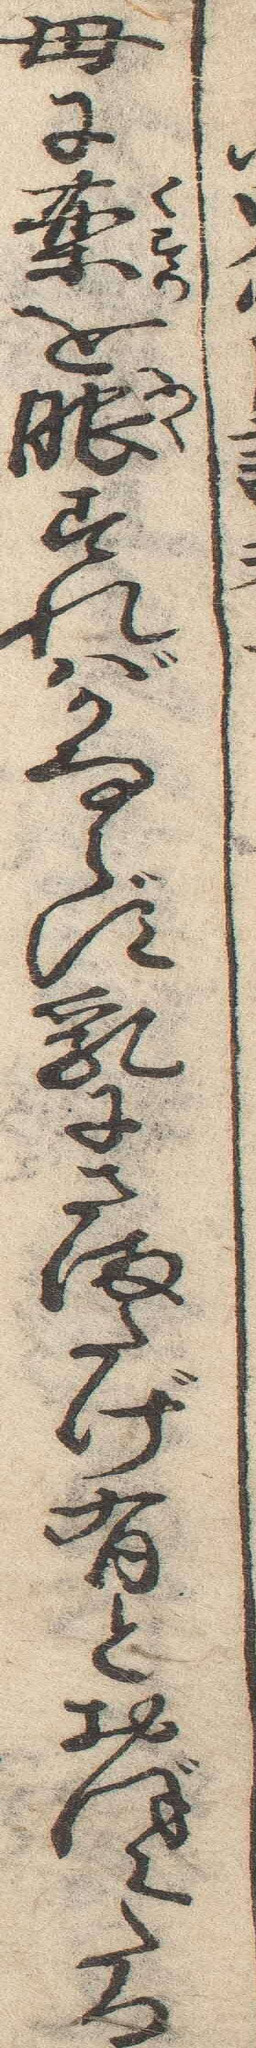母に薬を服すればかならず乳にさまたげ有とおぼえたる
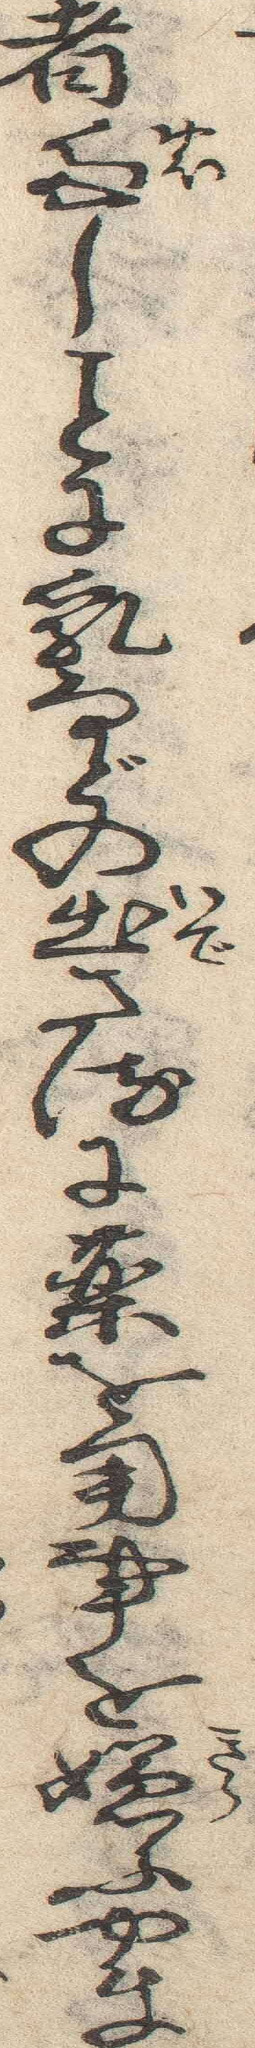者多しことに乳などの出さるに薬を用事を嫌ふやま
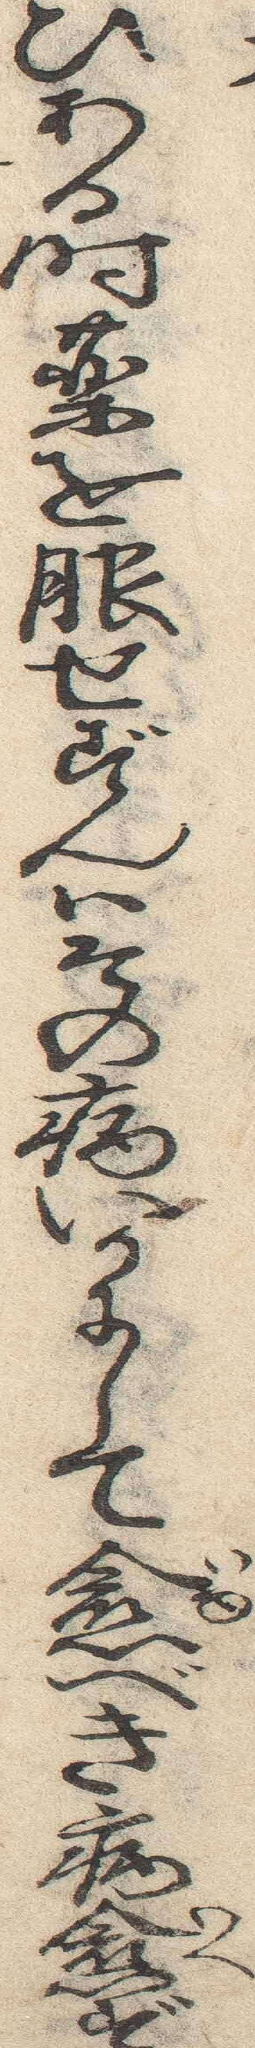ひある時薬を服せずんはその病いかにして愈べき病愈ず
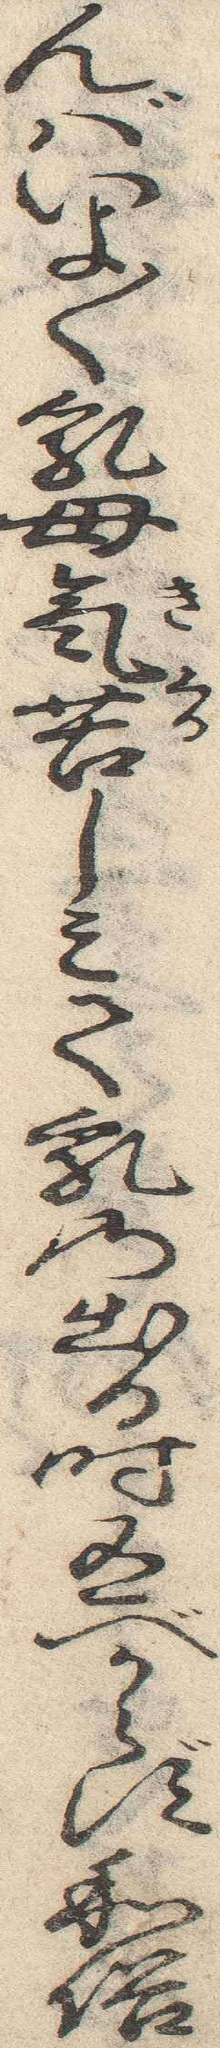んばいよ〳〵乳母気苦しみて乳の出る時有べからず和俗
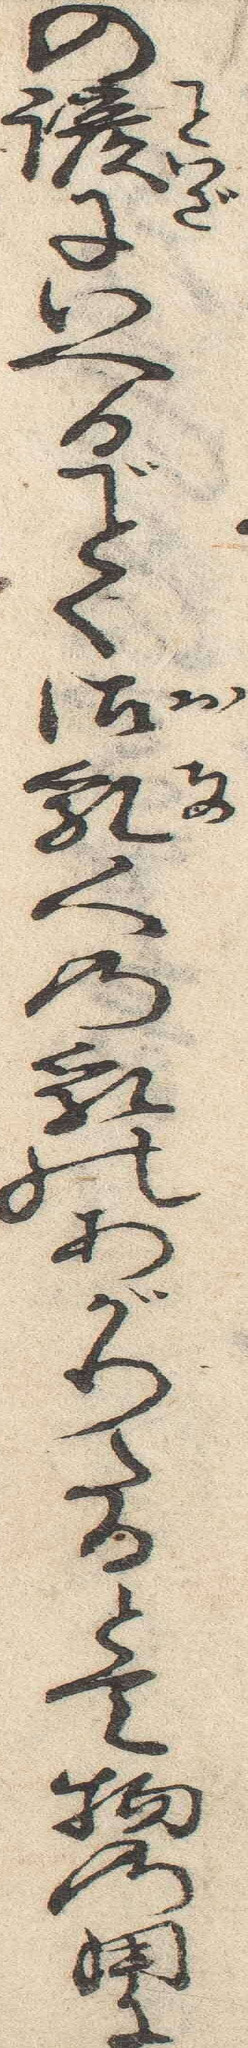の諺にいへるごとく御乳人の乳のあがりたるとて物の用に
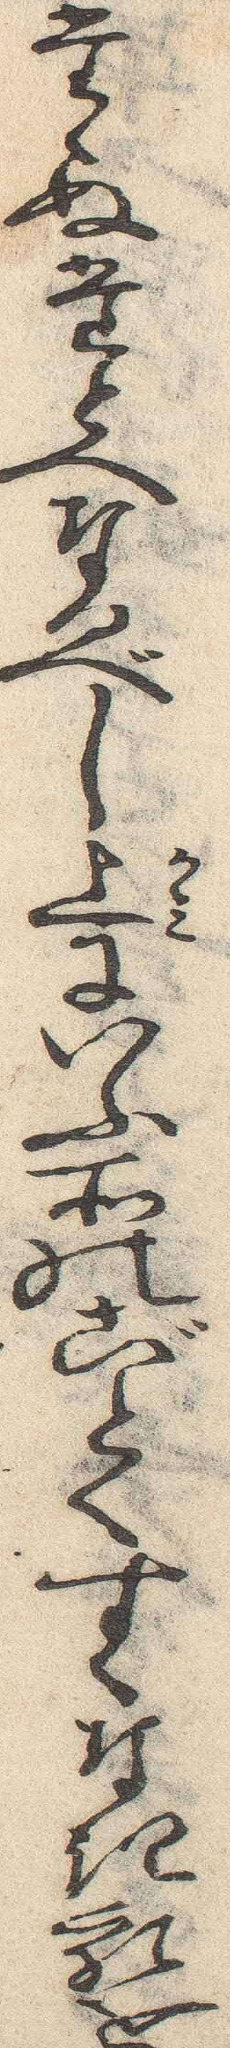たらぬたとへなるべし上にいふ所のごとくすくなき乳を
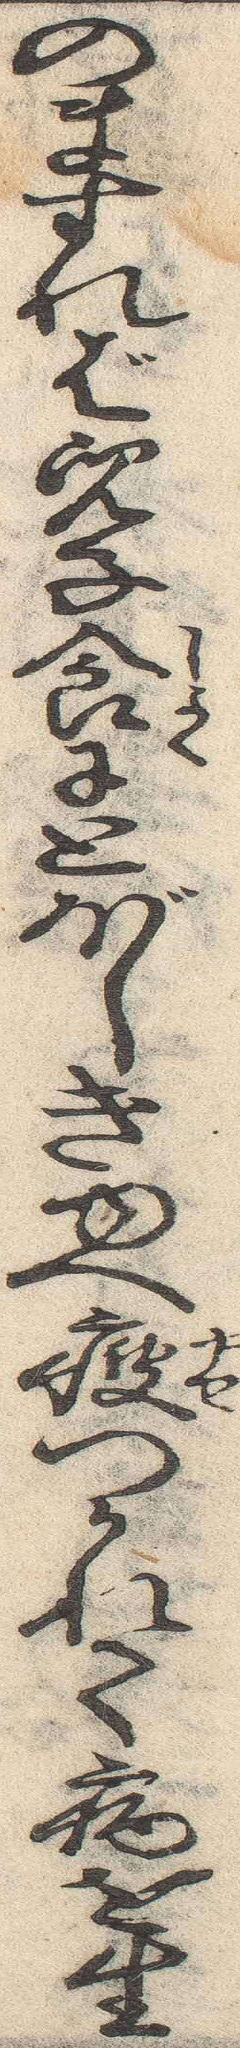のますれば児子食にとぼしきゆへ痩つかれて病を生
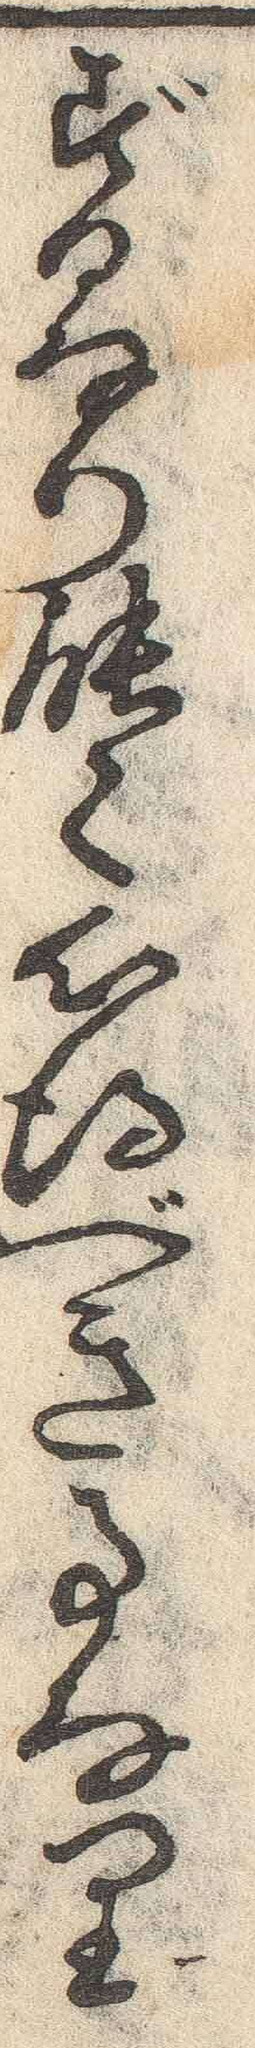ずるなり能々心得べきことなり
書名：小児必用養育草
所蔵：東京学芸大学附属図書館 国文学研究資料館
